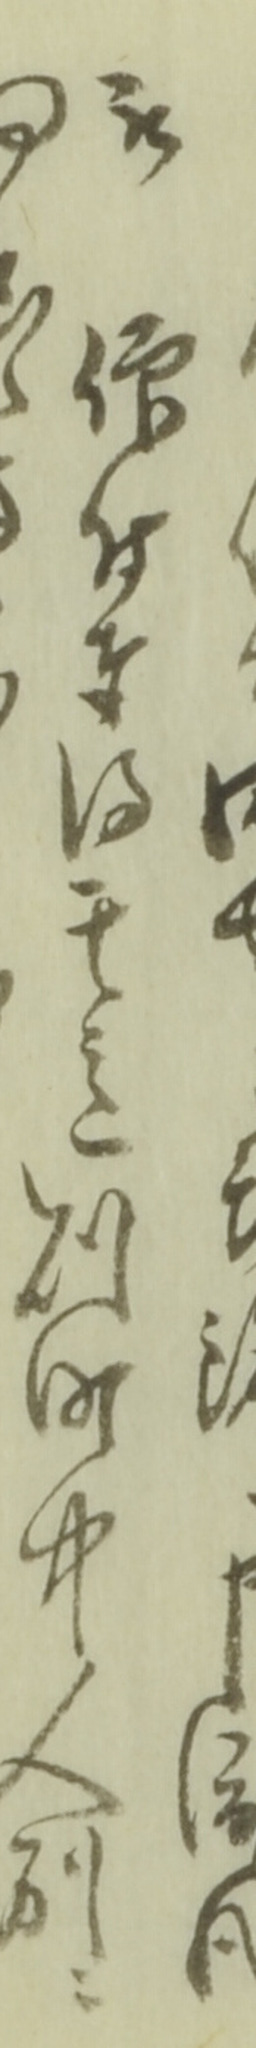被仰付奉得其意則町中人別ニ
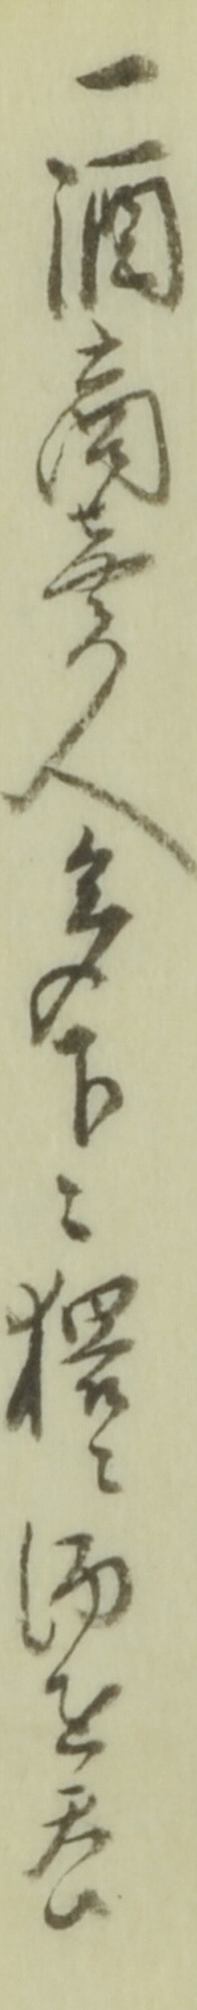一酒商売人多下々猥ニ酒を呑
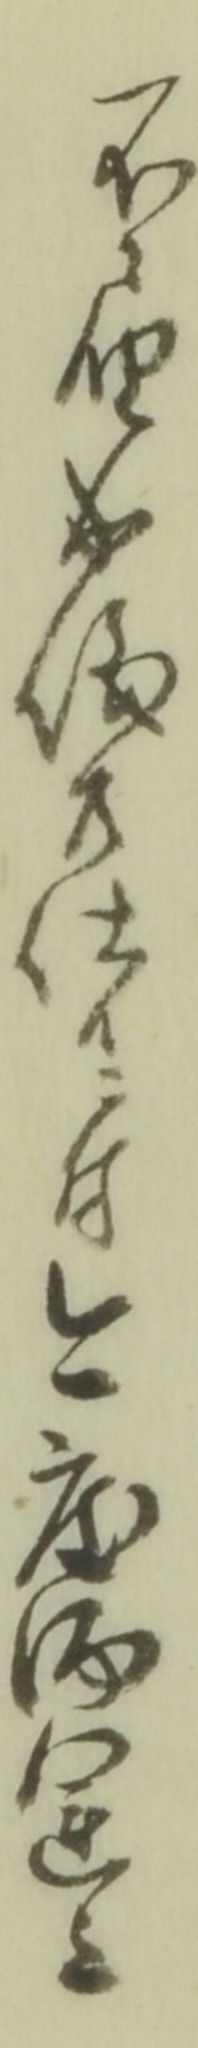不届成儀共仕候ニ付今度酒運上
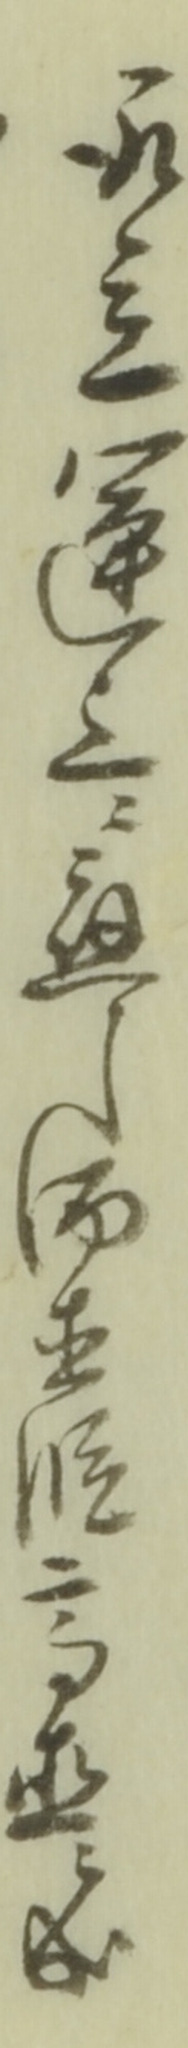取立運上ニ応し酒直段高直ニ成
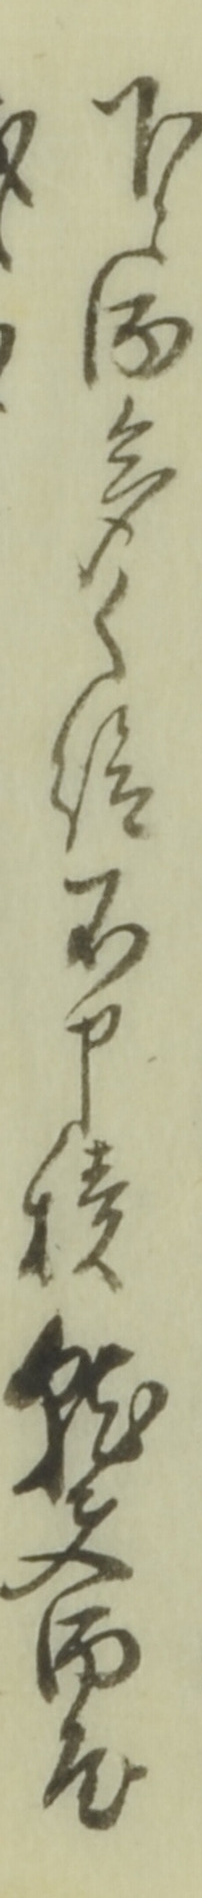下々酒多く給不申積就夫酒屋
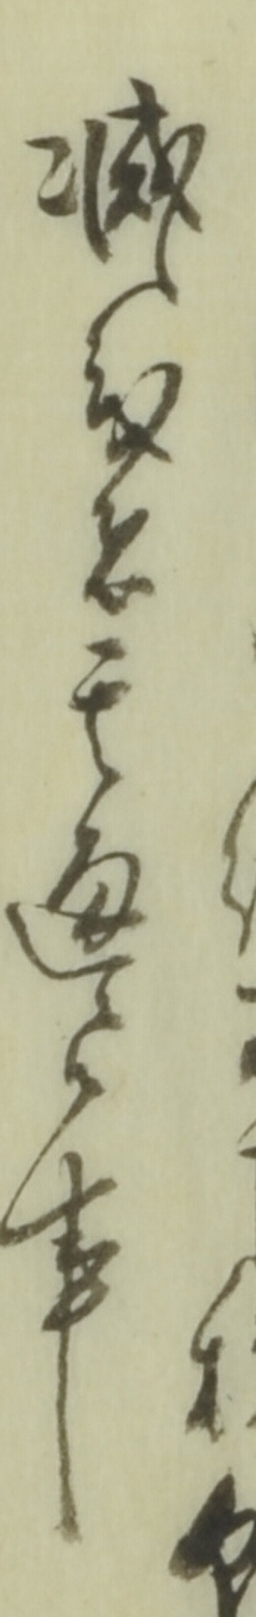滅候義者其通ニ候事
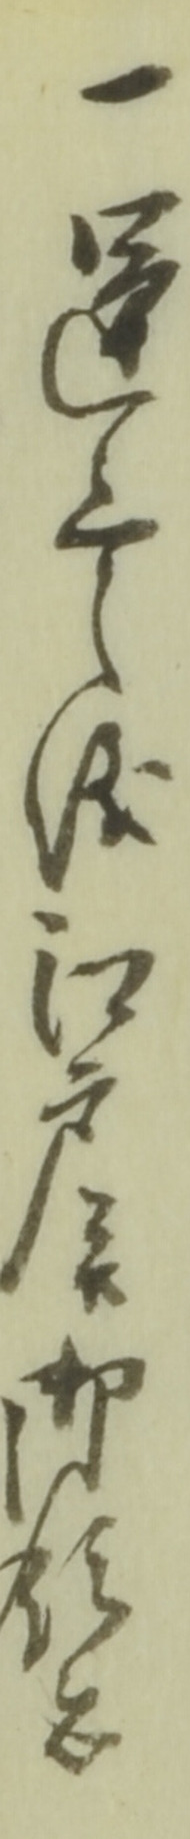一運上之儀江戸并御領者
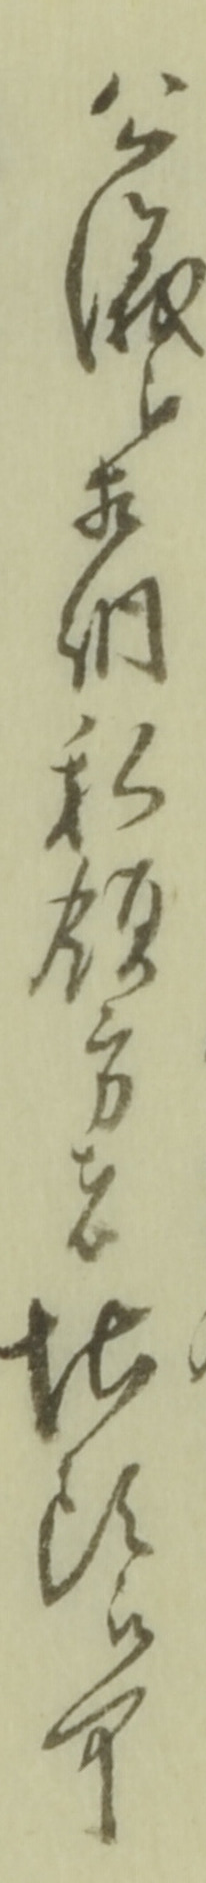公儀江相納私領方者地頭江可
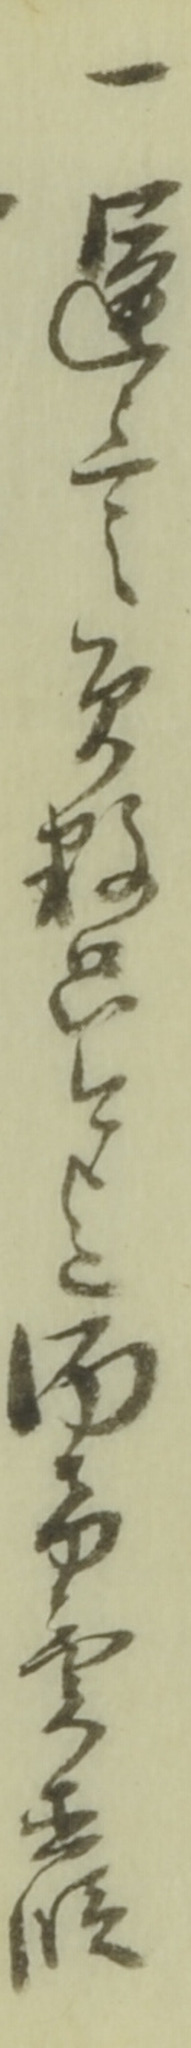一運上之員数只今迄酒商売直段
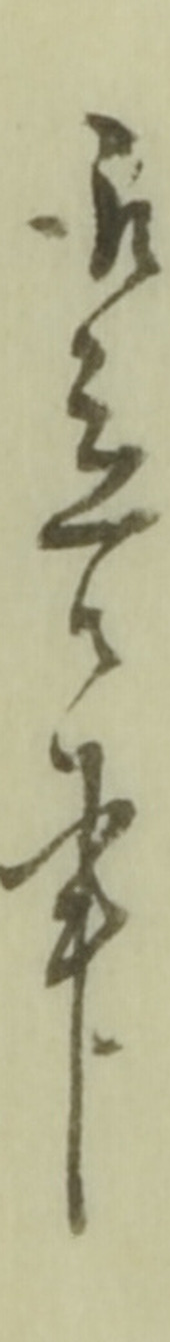取立之事
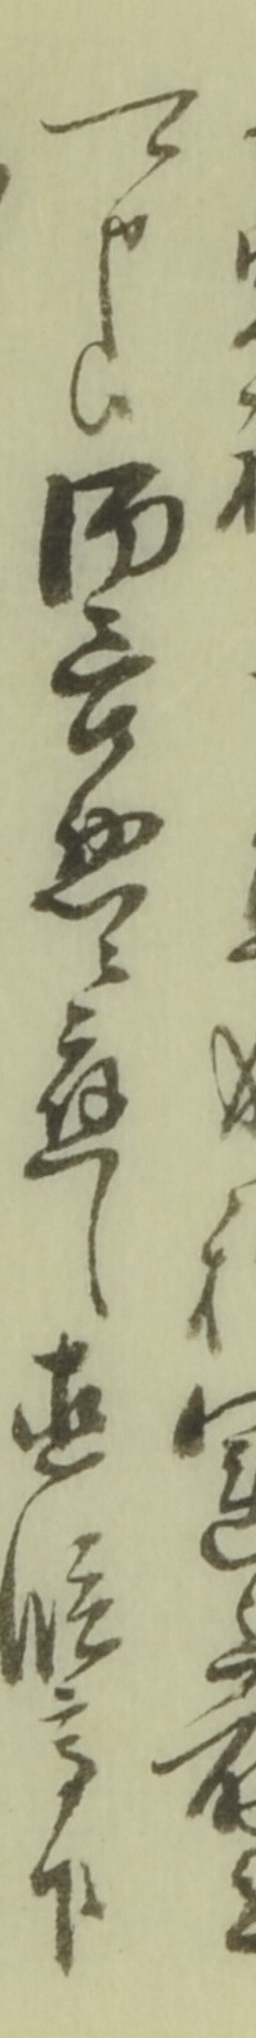可申候酒善悪ニ応し直段高下
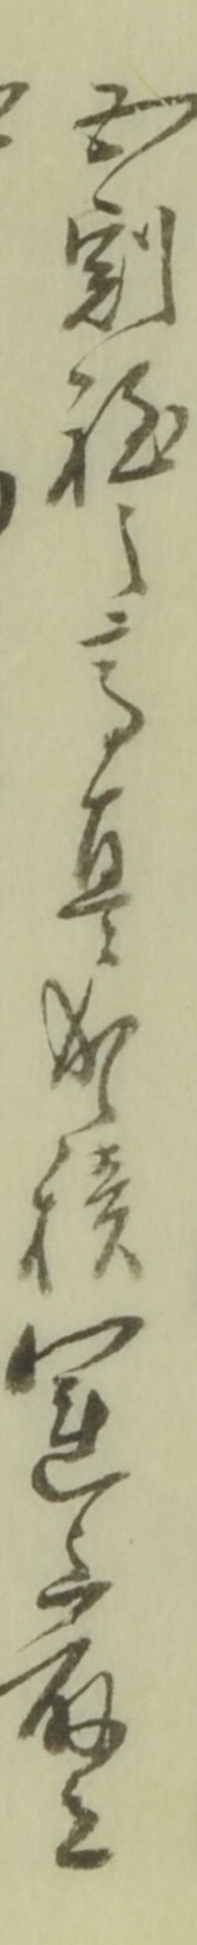五割程之高直ニ成候積運上取立
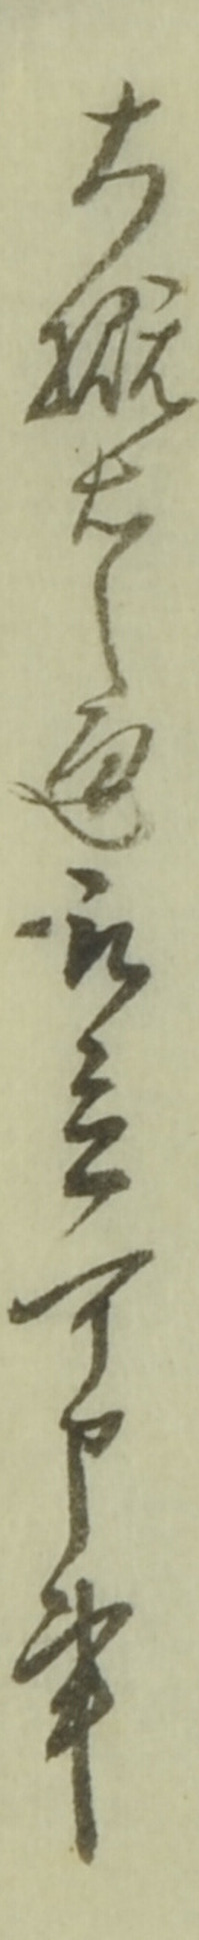大概右之通取立可申事
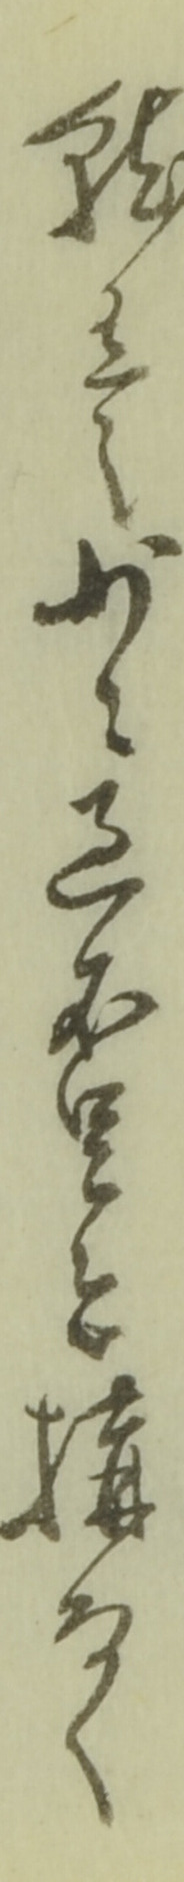就有之少々過不足者構なく

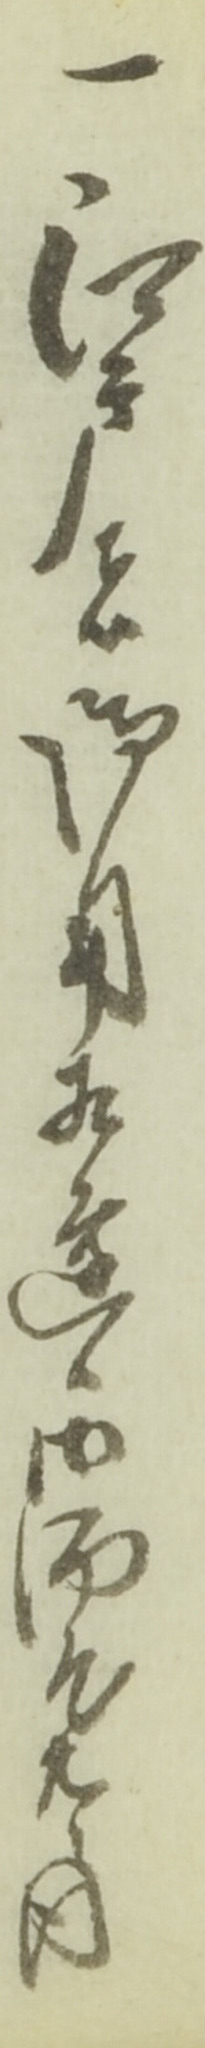一江戸者御用相達候御酒屋共之内
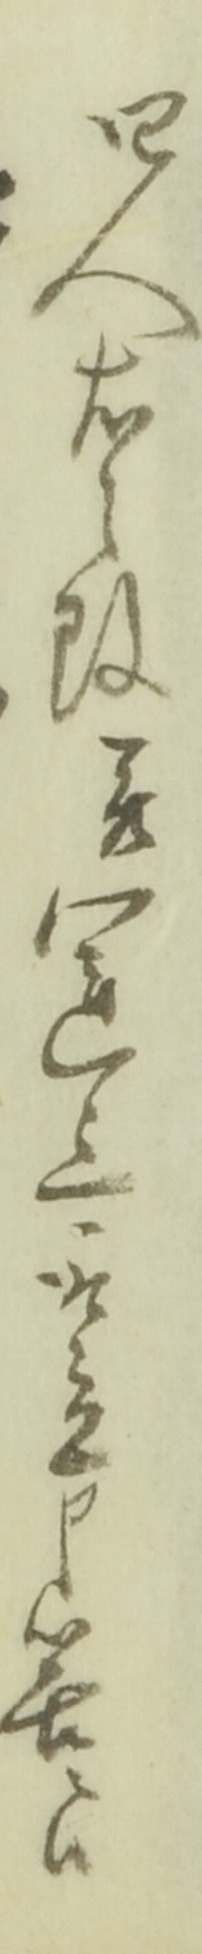四人右之改并運上取立申筈ニ候
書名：御公儀様御領主様御触書控
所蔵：伊那市立高遠町図書館・合同会社AMANE
